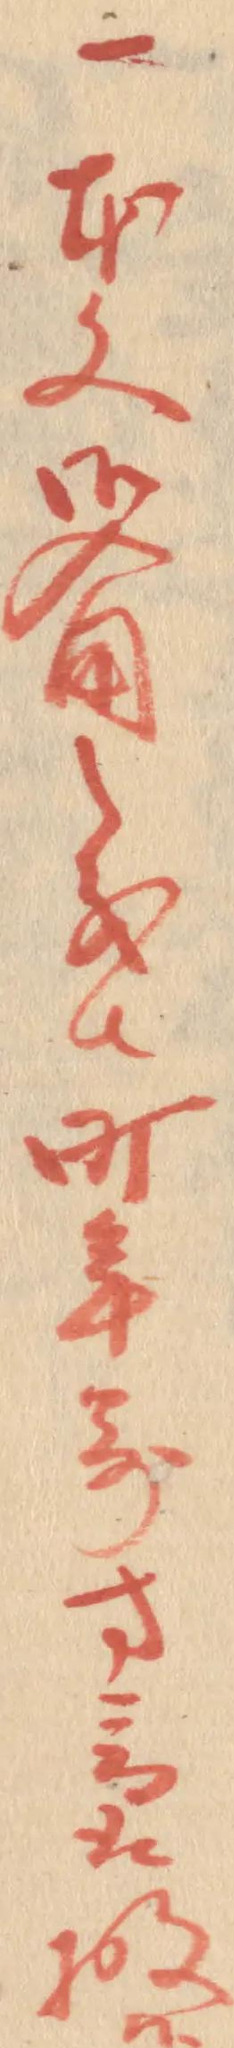一本文御入用之義は町年寄方ニ而取扱候
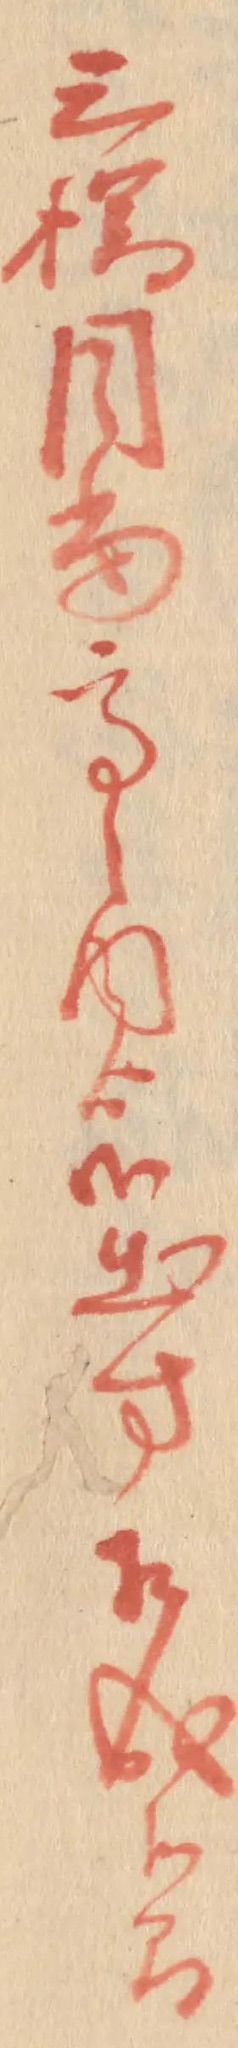三橋目当高之内ゟ御出方相成候間
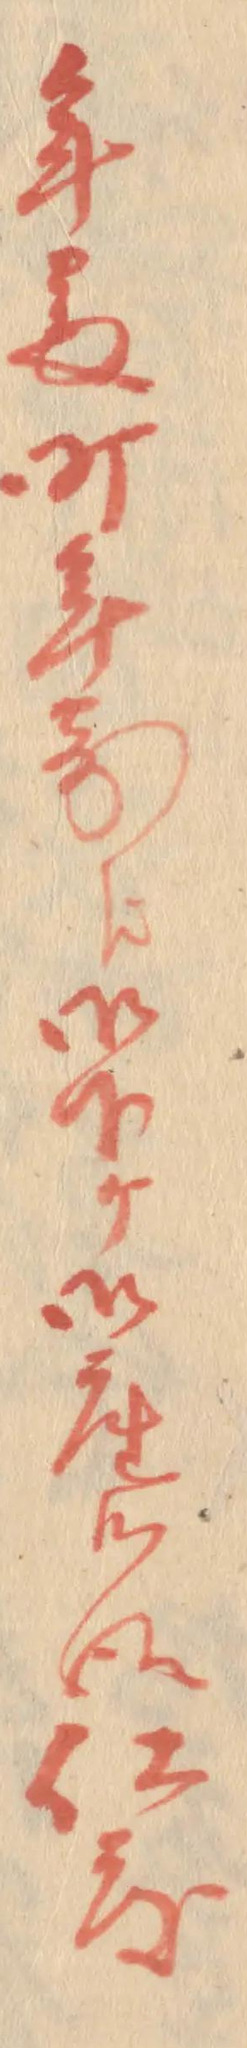年番町年寄え御下ケ御座候様仕度
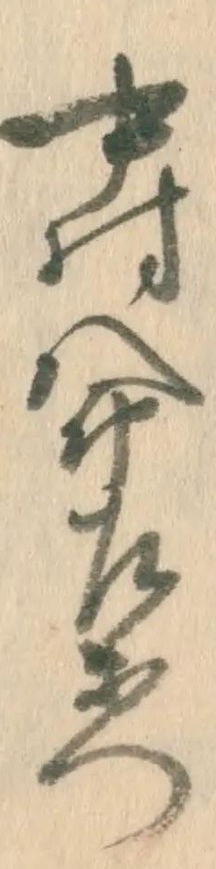中村八郎左衛門

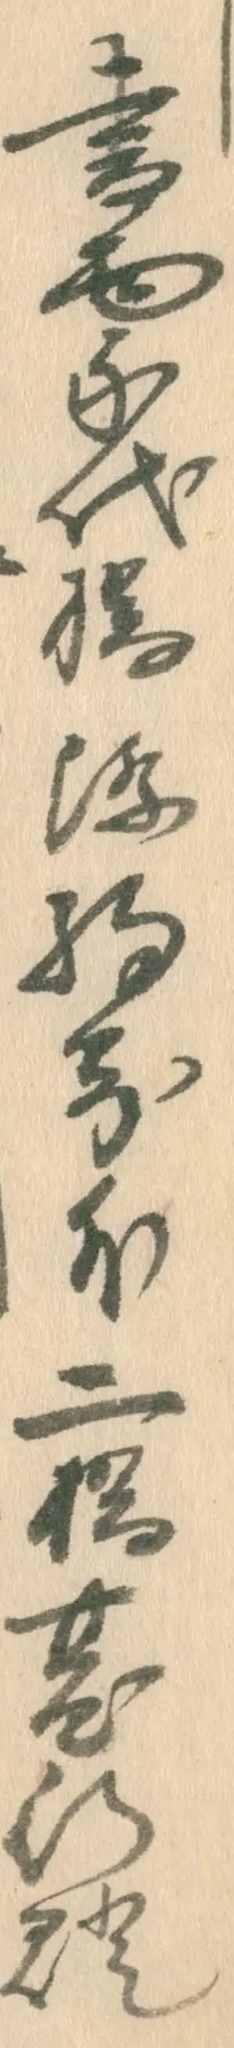書面永代橋際駒寄外二橋台行灯
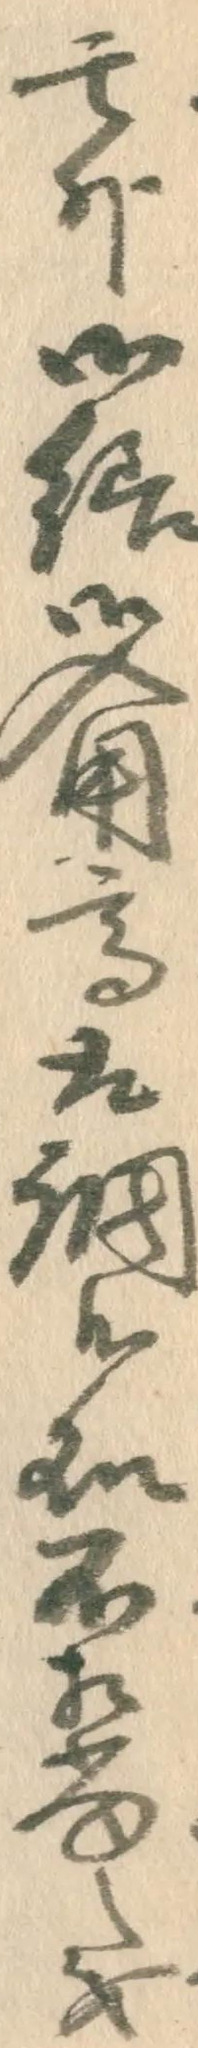其外御繕御入用高取調候処不相当之義
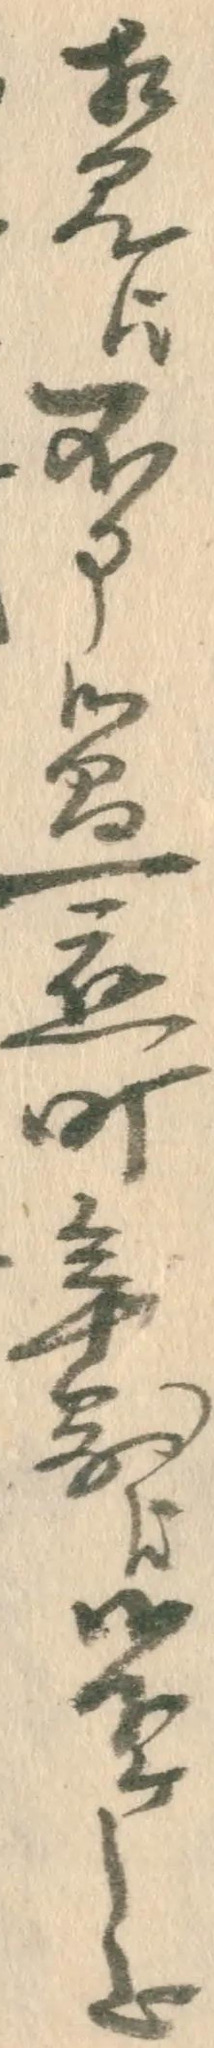相見え不申候間一応町年寄え御下ケ之上
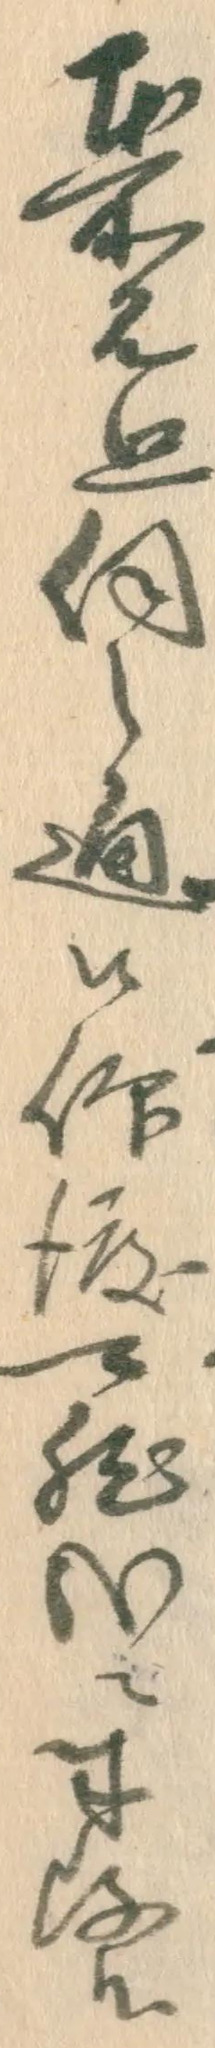本所見廻伺之通被仰渡可然哉ニ奉存候
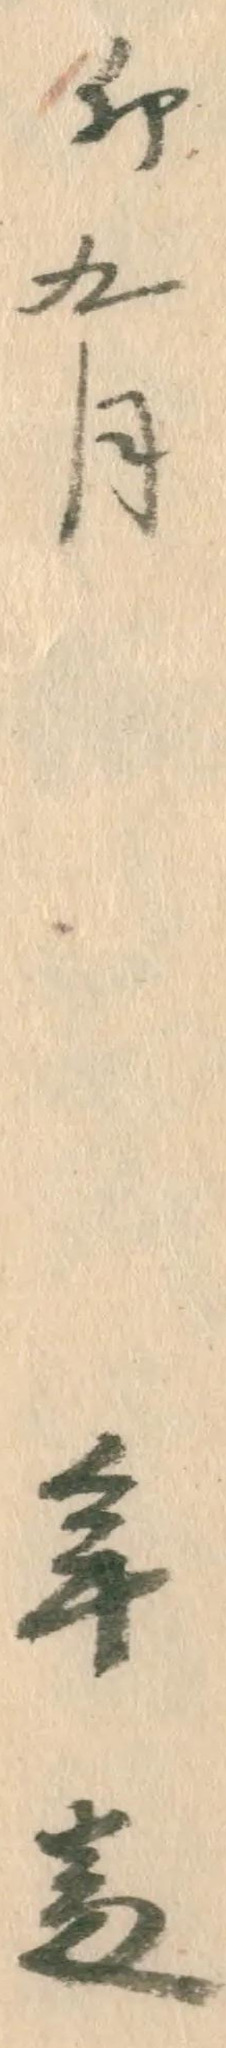卯九月年番
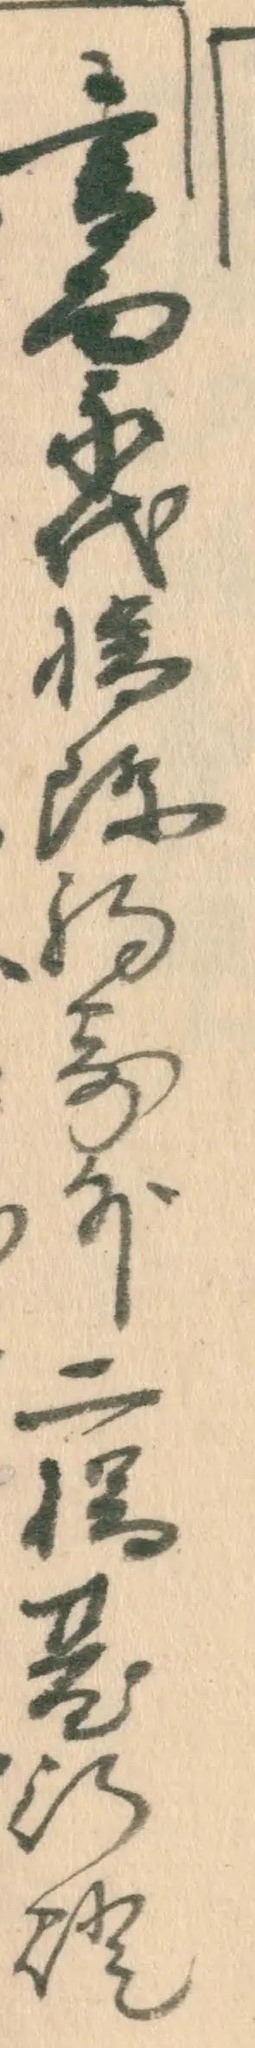書面永代橋際駒寄外二橋台行灯
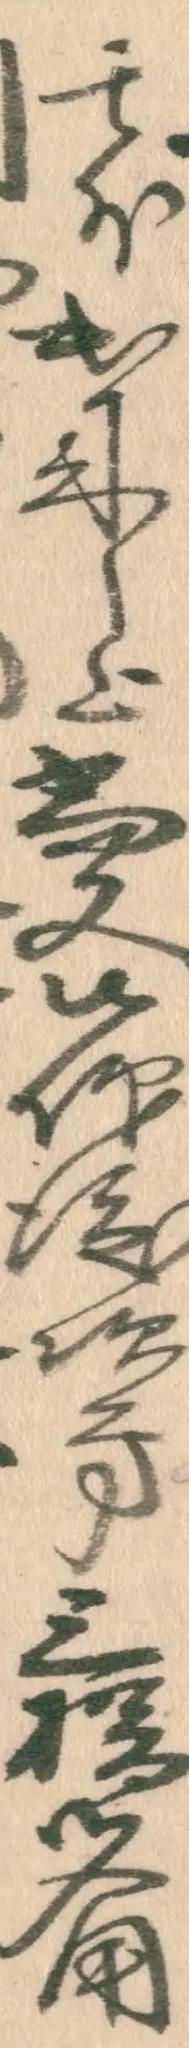其外出来之上尚又被仰渡次第三橋御入用
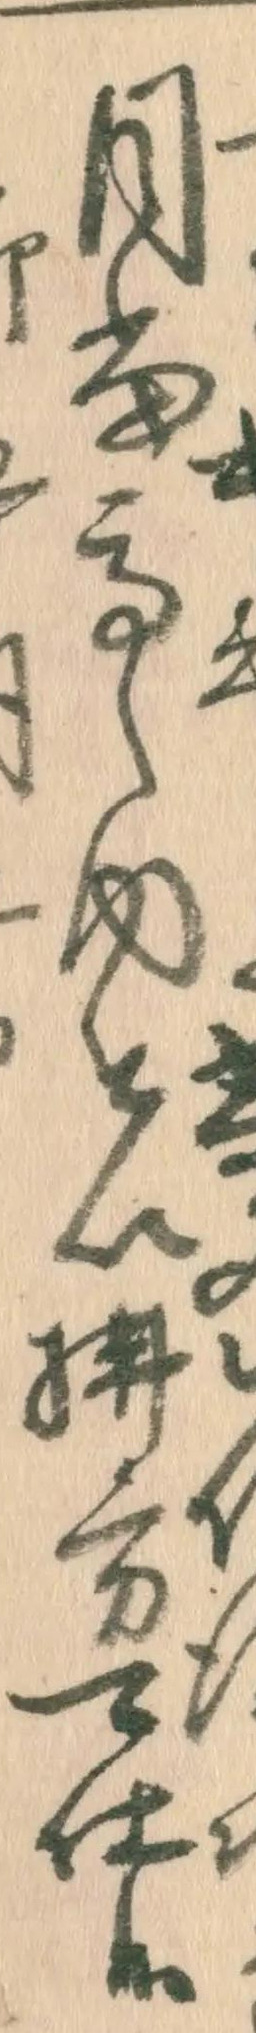目当高之内を以払方可仕候
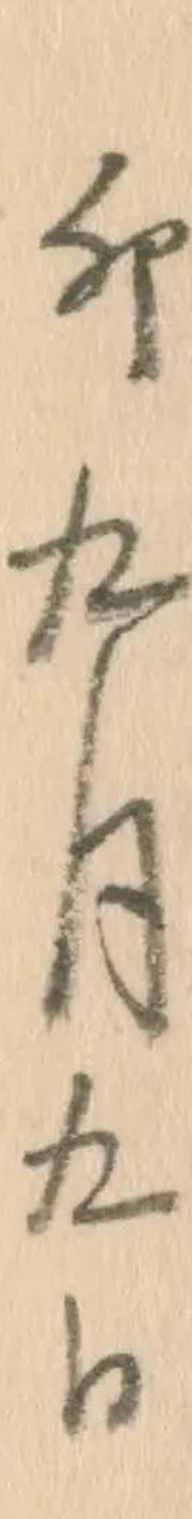卯九月九日
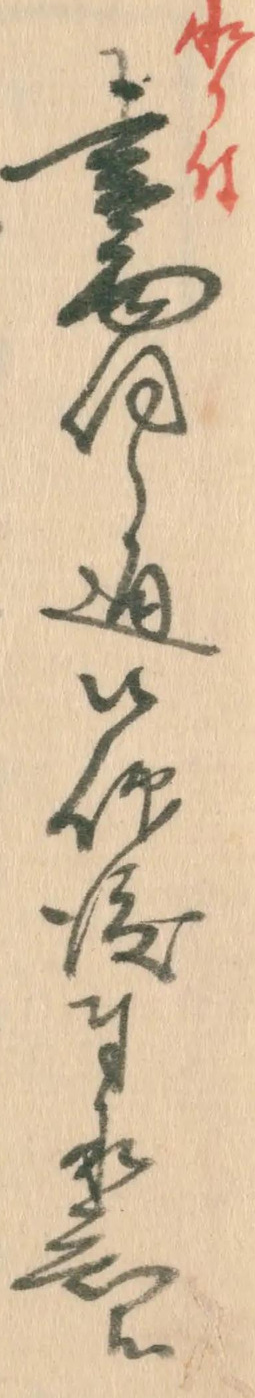書面之通被仰渡奉承知候
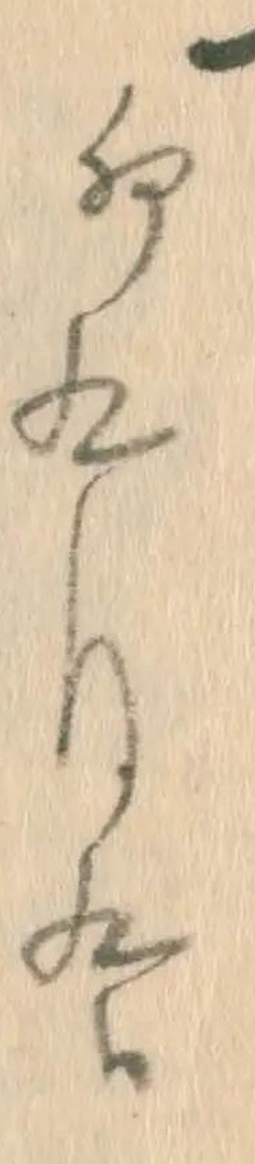卯九月九日

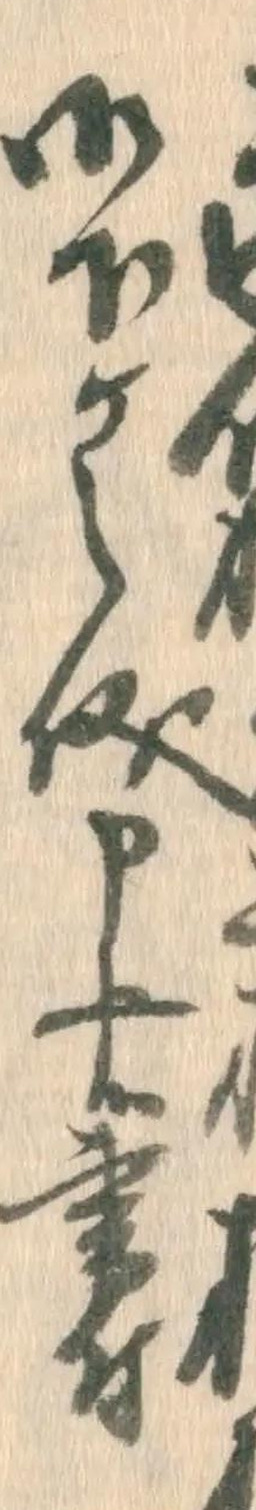御下ケ之儀申上候書付
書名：三橋 17巻. [8] 三橋小破御修復書留　但御奉行御掛リ替地震潰橋番屋　嘉永四亥年より安政二卯年迄　下
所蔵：国立国会図書館 National Diet Library, JAPAN
